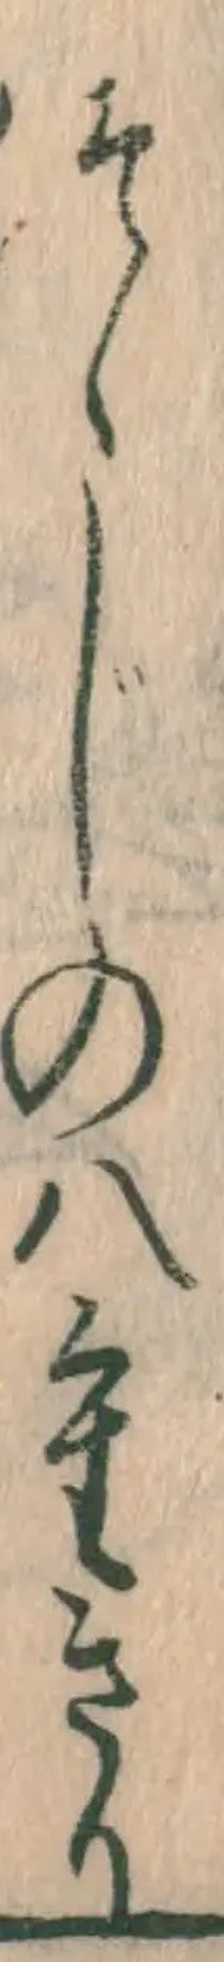つゝじの八重きり
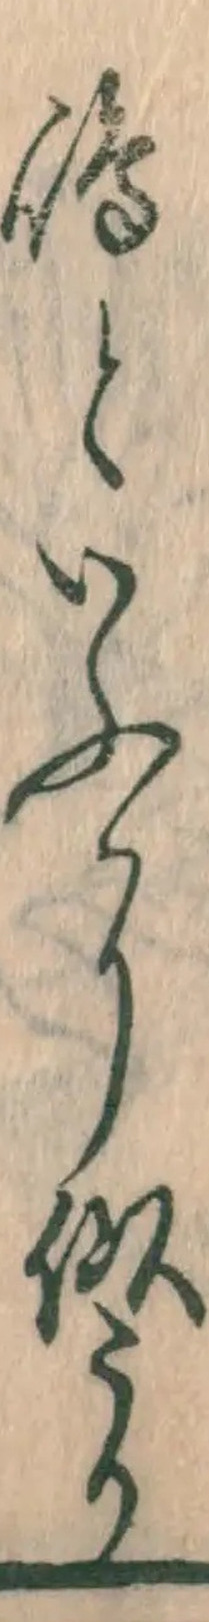嶋といふに似たり
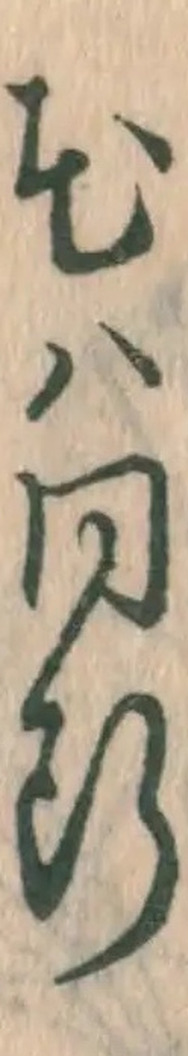花は同断

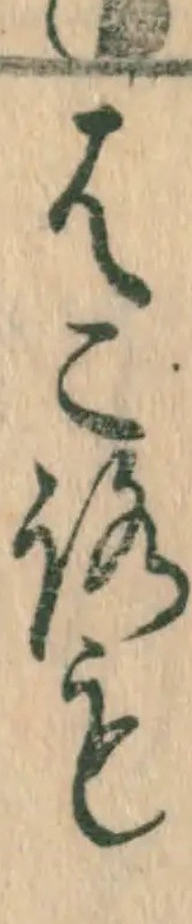はころも
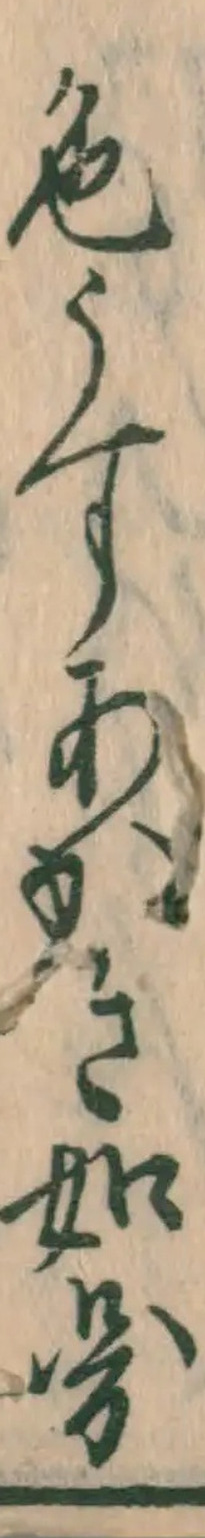色うすあかき如図
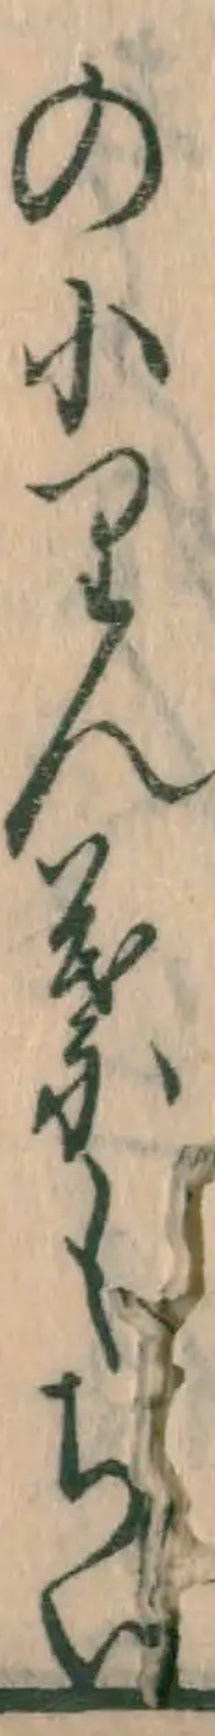の小りん葉もちい
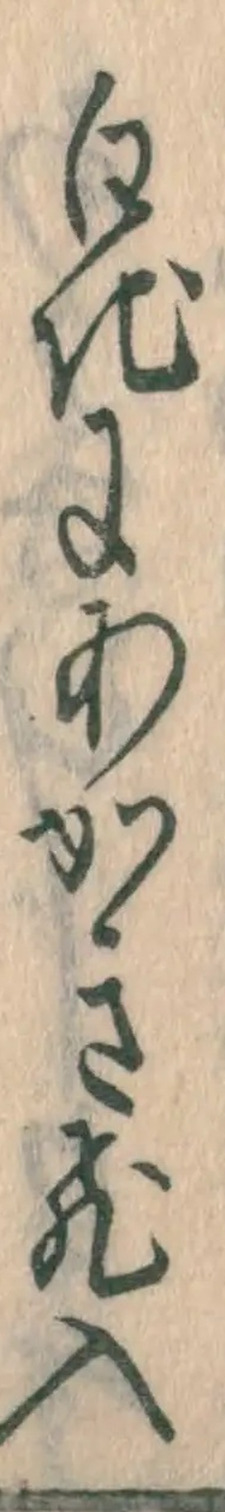白地にあかき飛入
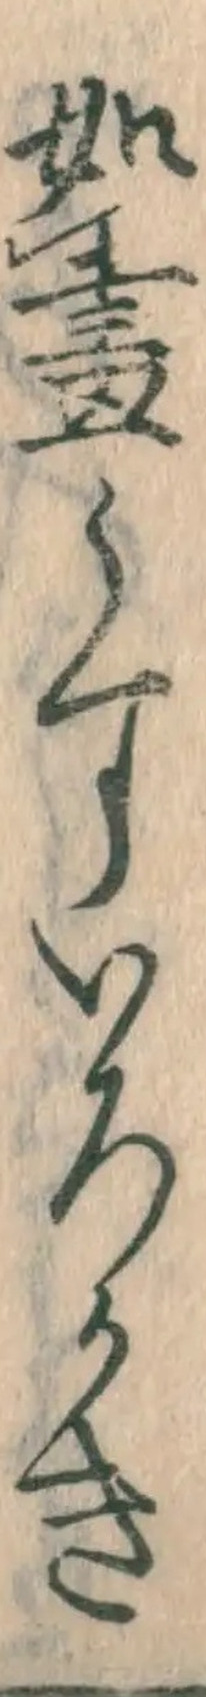如畫うすいろかき

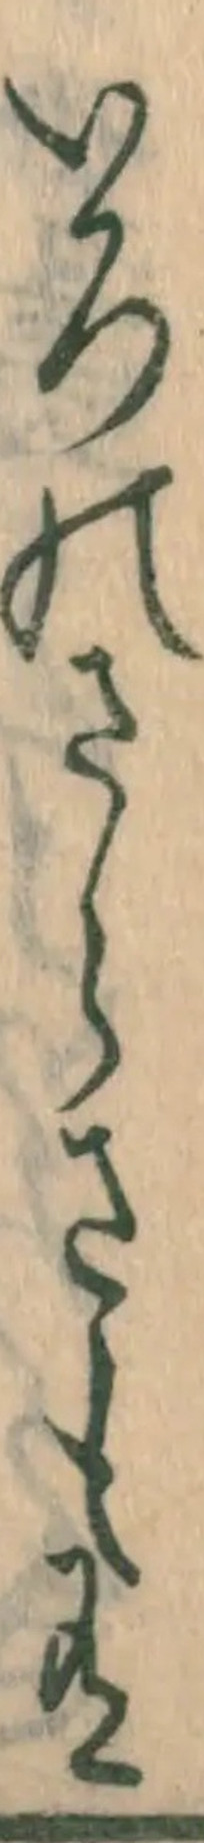いろのさらさも有
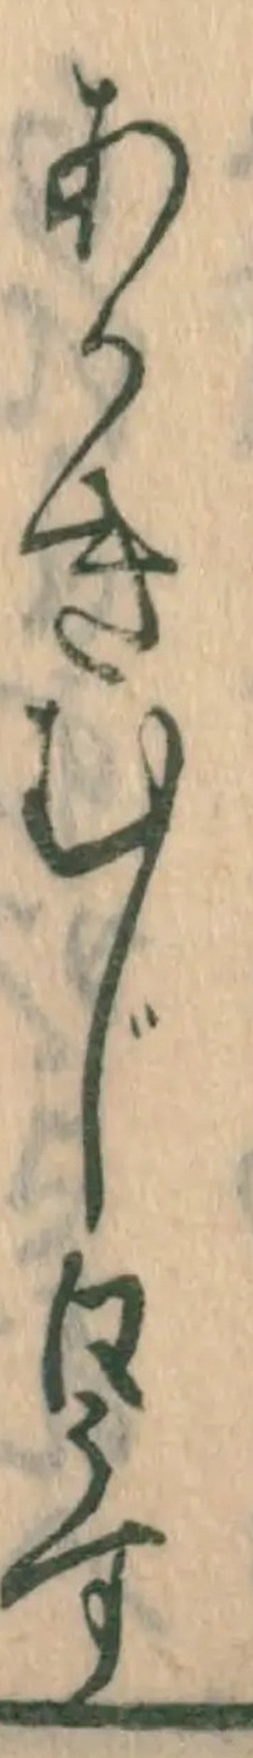あかきむじ白うす
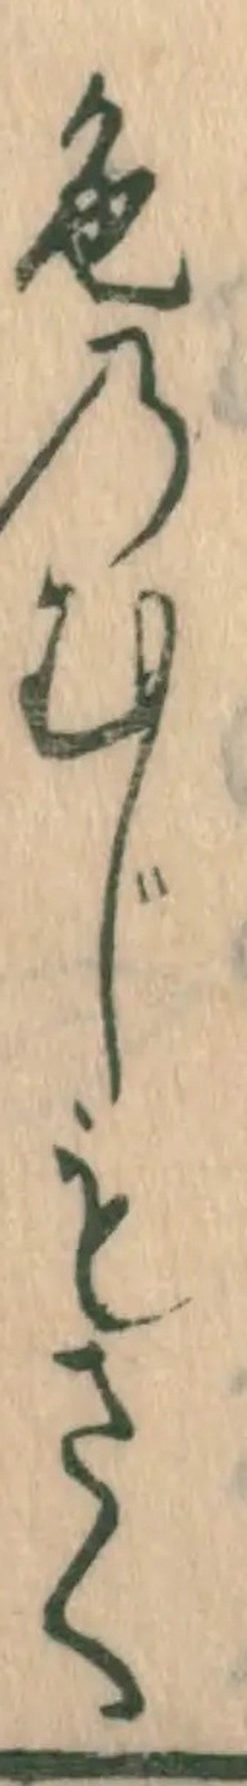色のむじもさく
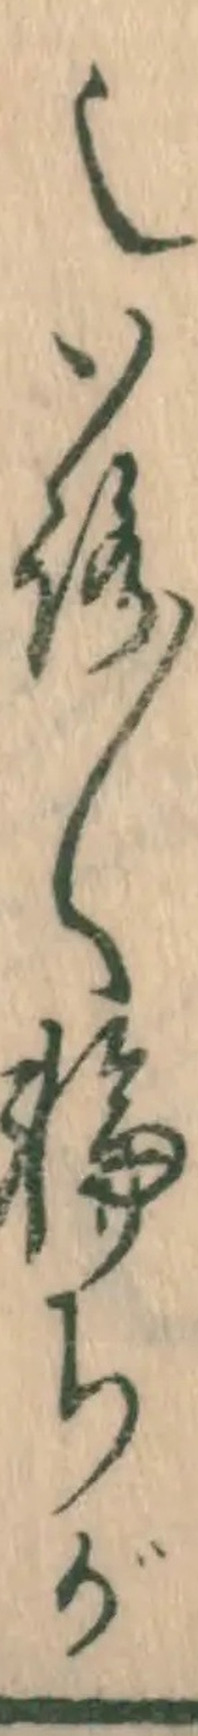也いろ〳〵輪ちが
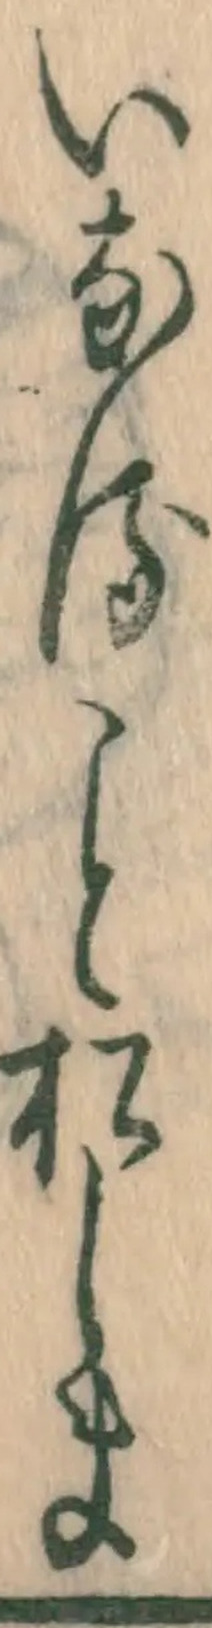いなること松しま
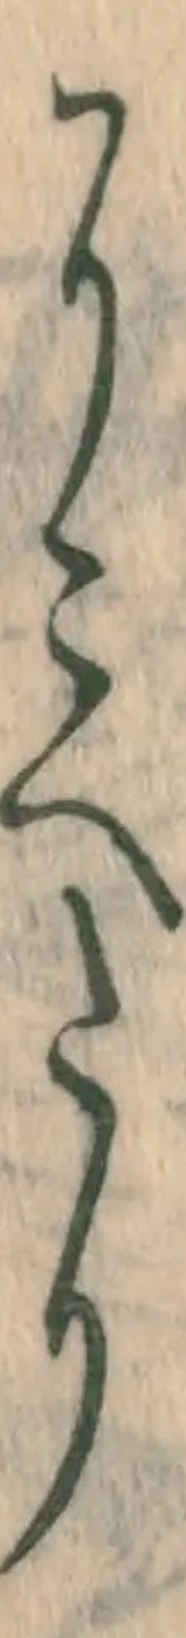にこへたり
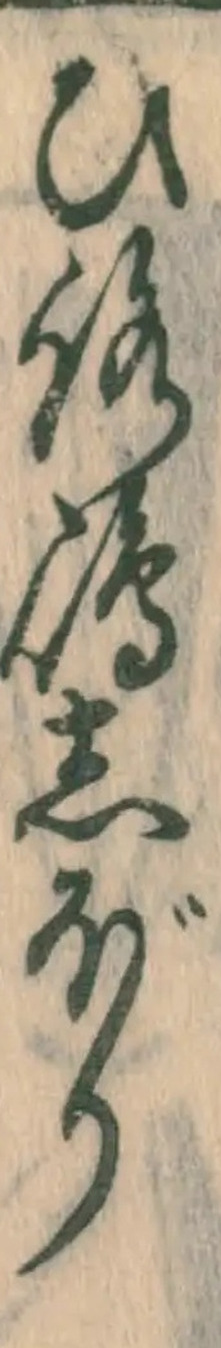ひろ嶋しぼり
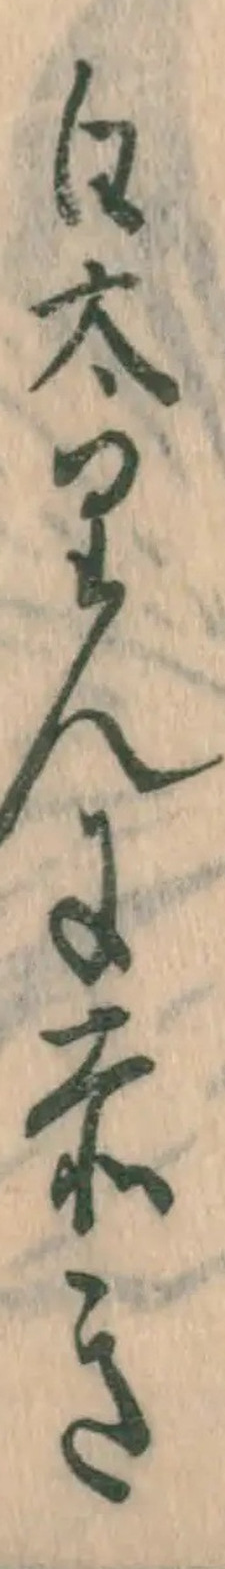白太りんに赤き
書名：錦繍枕 5巻. [4]
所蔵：国立国会図書館 National Diet Library, JAPAN
